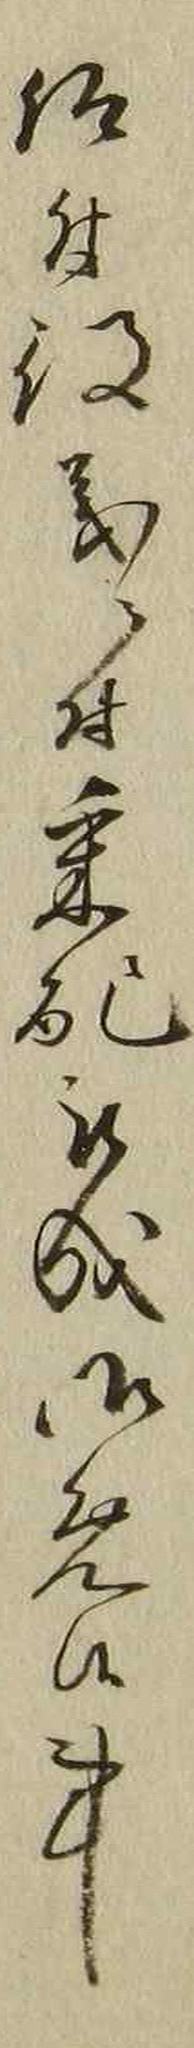仰付役義ニ付采配被成御免候事
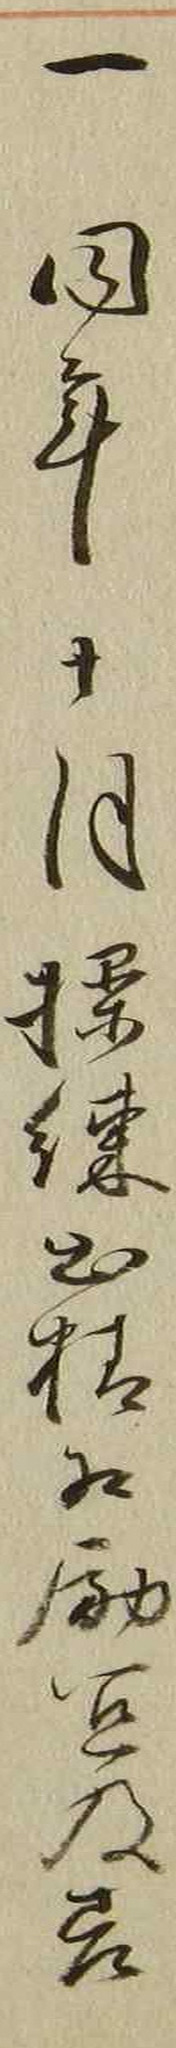一同年十月操練出精相励宜及差
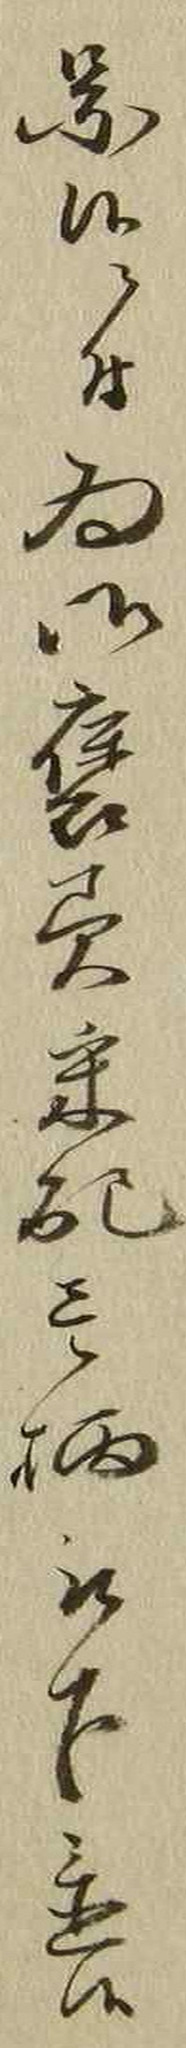図候ニ付為御褒美采配壱柄被下置候
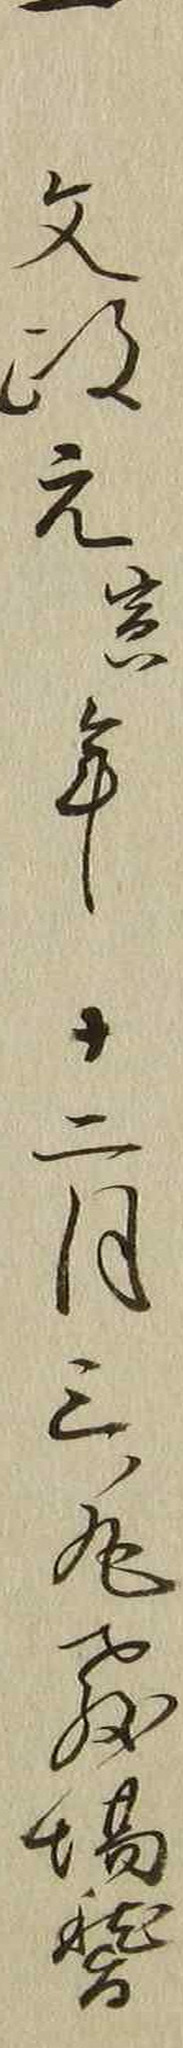一文政元寅年十二月三ノ丸教場稽
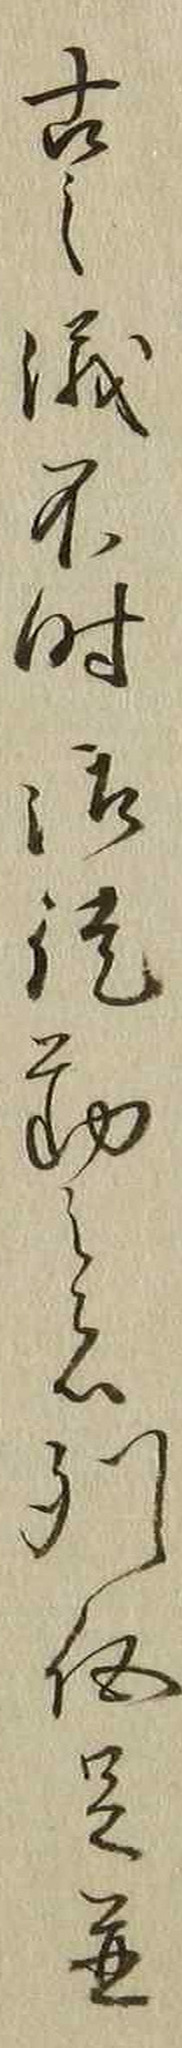古之儀不時御徒勤之者列伍足並
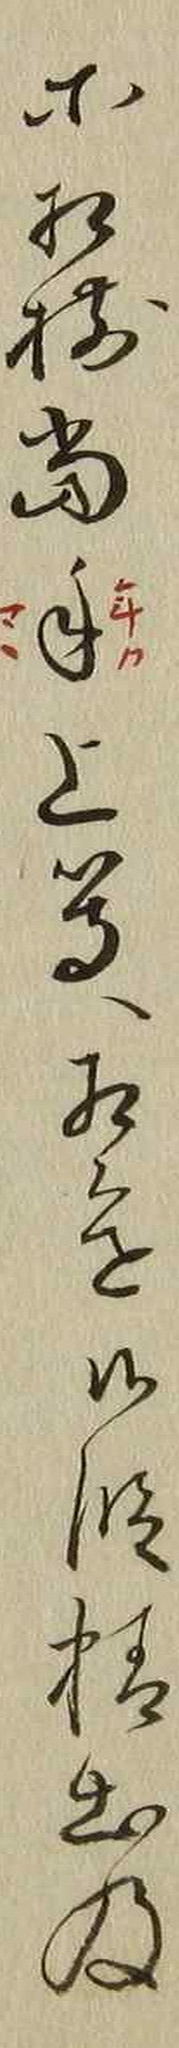等相揃当年上等ヘ相進候段精出及
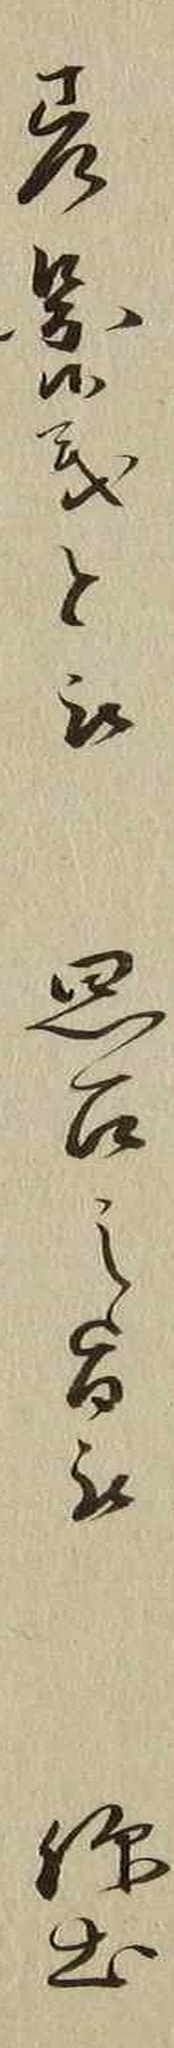差図義と被思召之旨被仰出
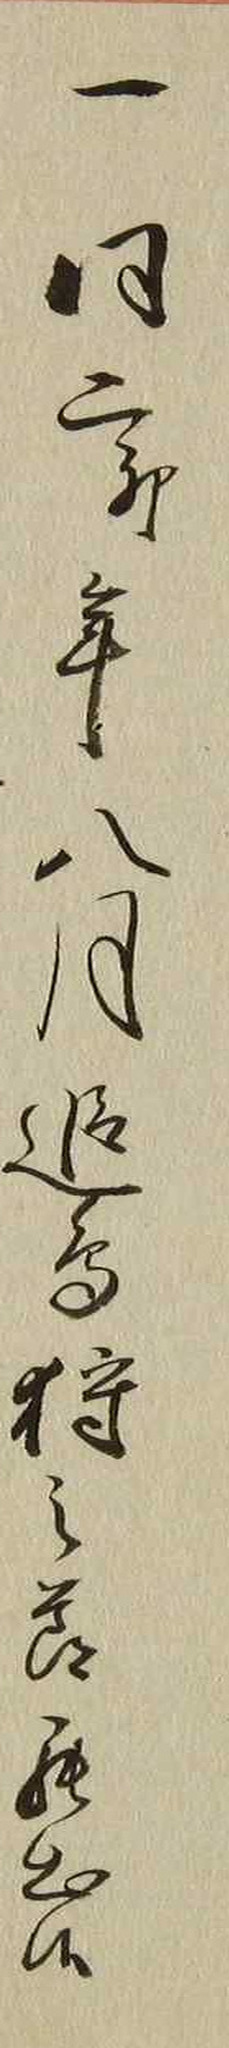一同二卯年八月追鳥狩之節罷出候
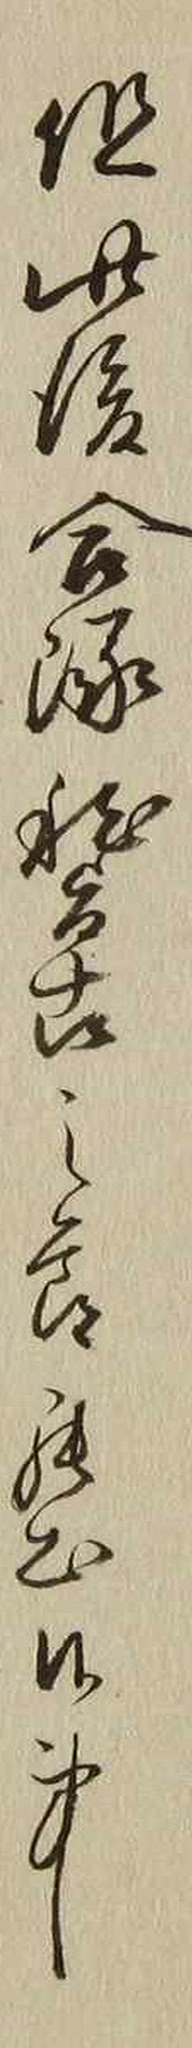但以後合隊稽古之節罷出候事
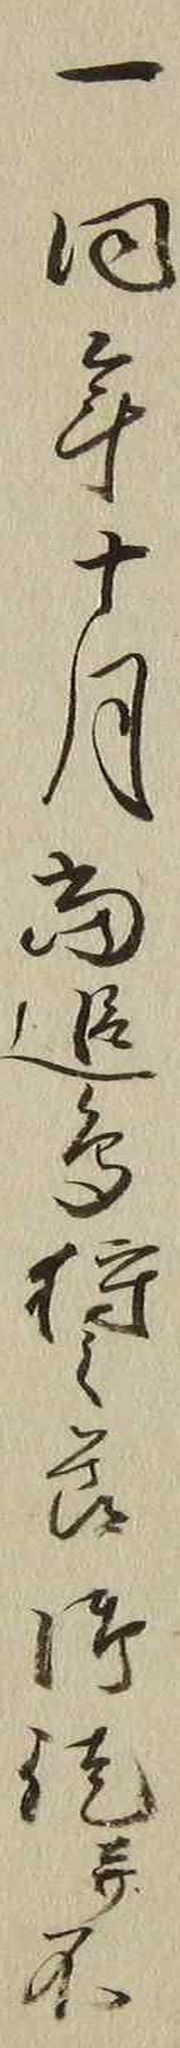一同年十月当追鳥狩之節御徒并不
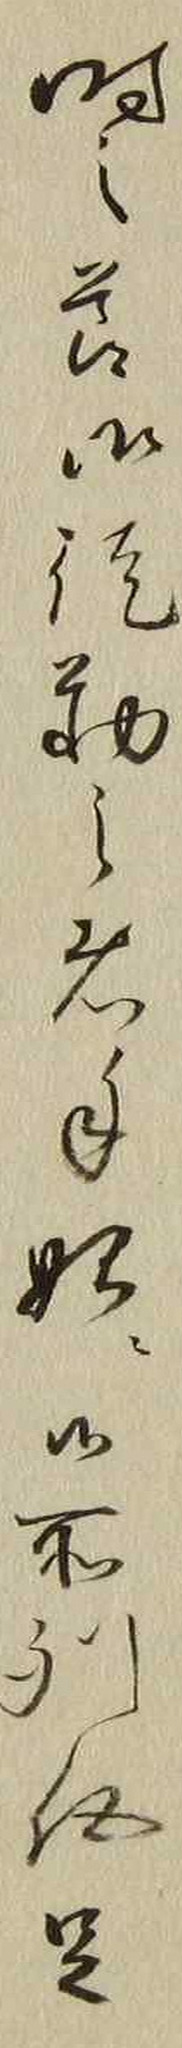時之節御徒勤之者手始ニ候所列伍足
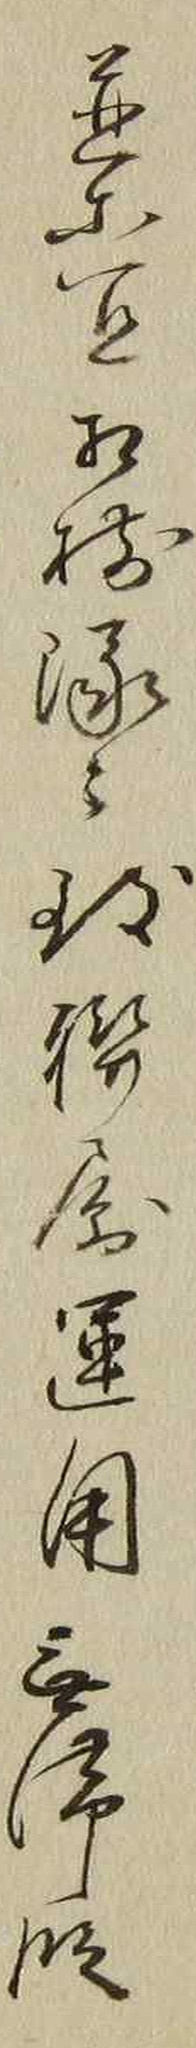並等宜相揃隊々致聯属運用無滞段
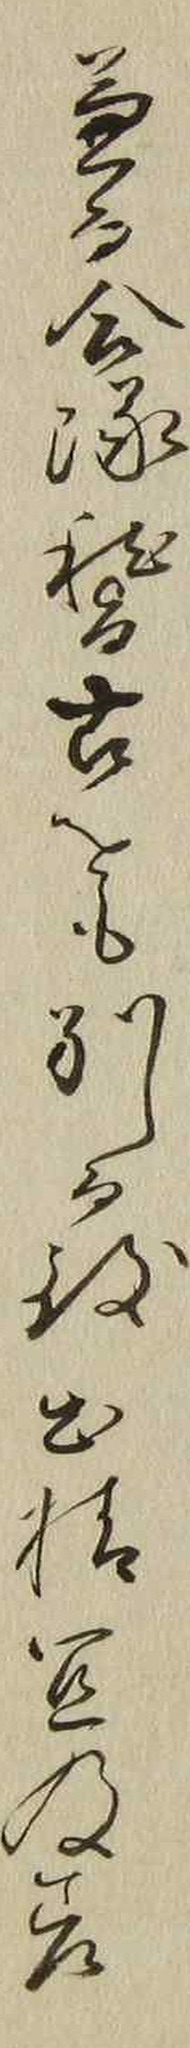兼而合隊稽古をも別而致出精宜及差
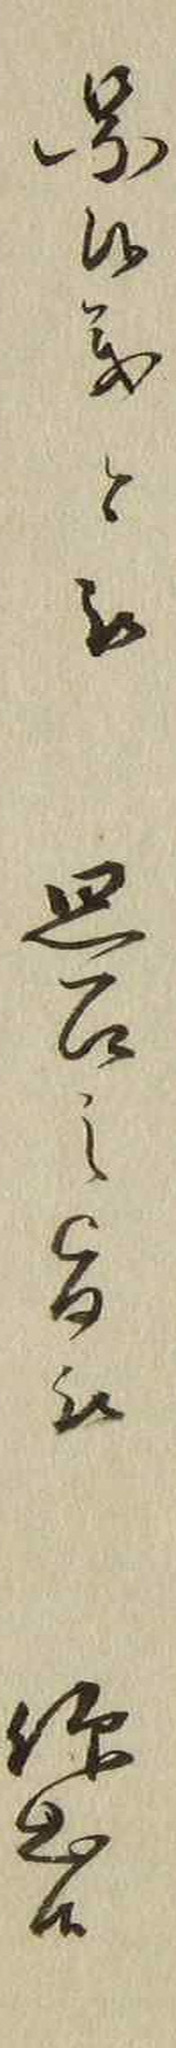図候義と被思召之旨被仰出候
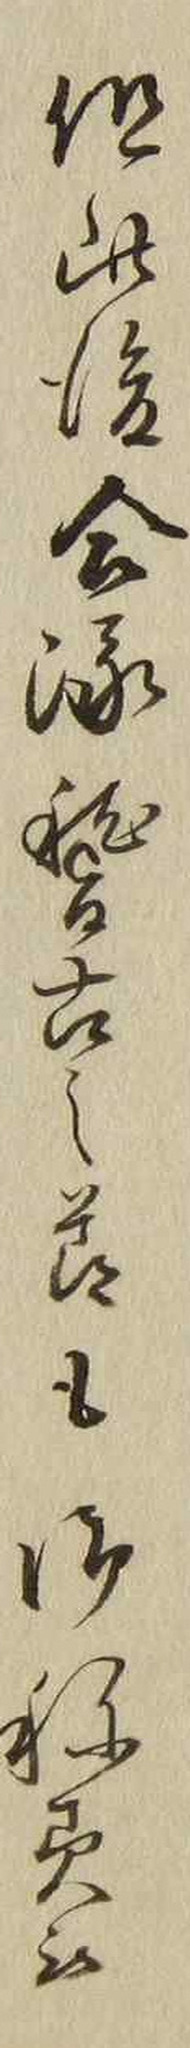但此後合隊稽古之節も御称美被
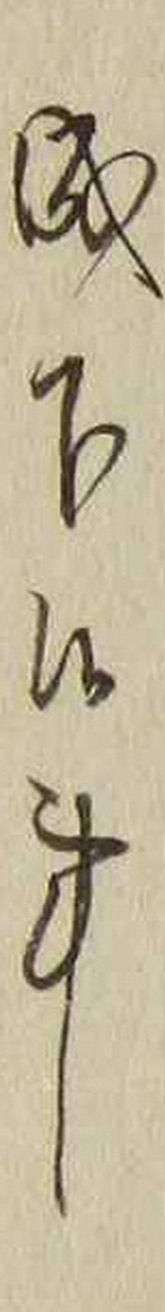成下候事
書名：諸士系譜　巻之68　を之部2
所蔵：会津若松市立会津図書館
